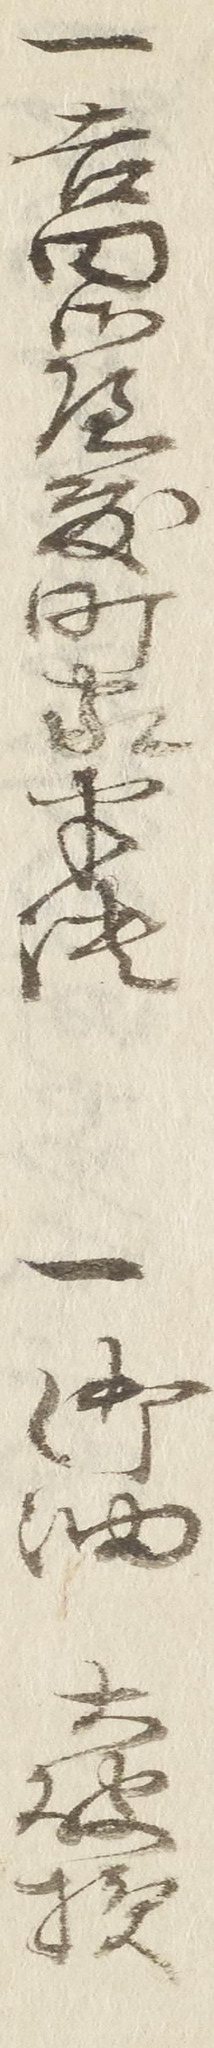一吉田御屋敷町家半潰一御油大破損
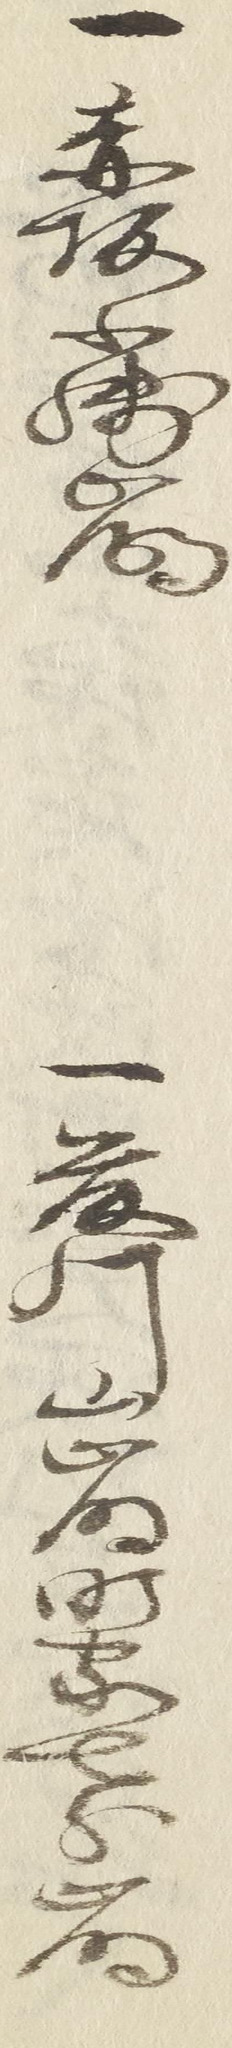一赤坂不残崩一藤川山崩町家七分崩
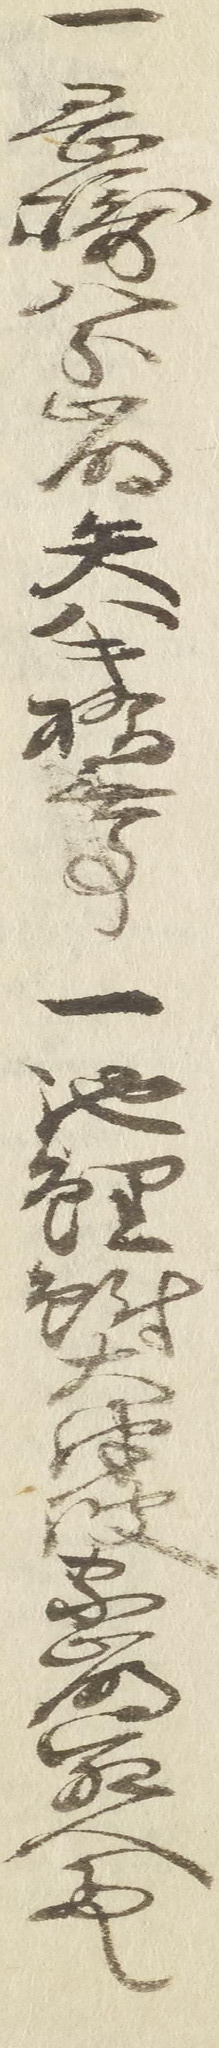一岡崎八分崩矢ハキ橋無事一池鯉鮒大津波家崩死人多し
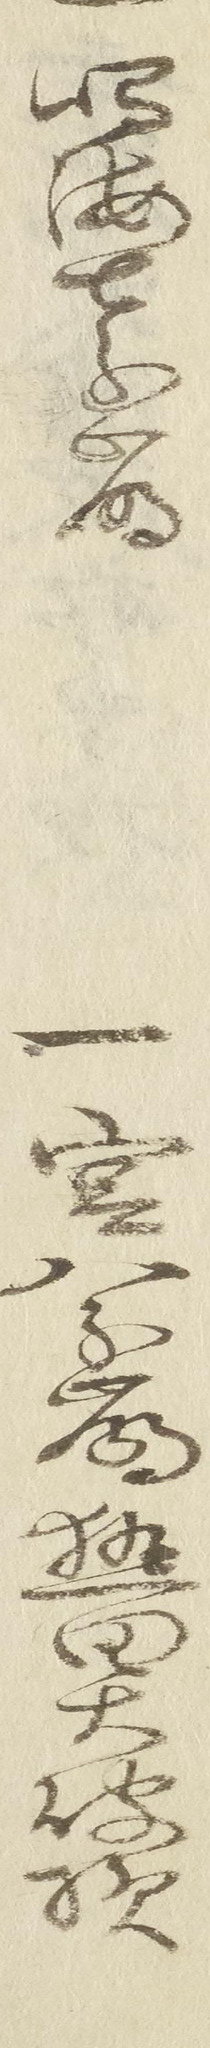一鳴海七分崩一宮八分崩熱田大破損

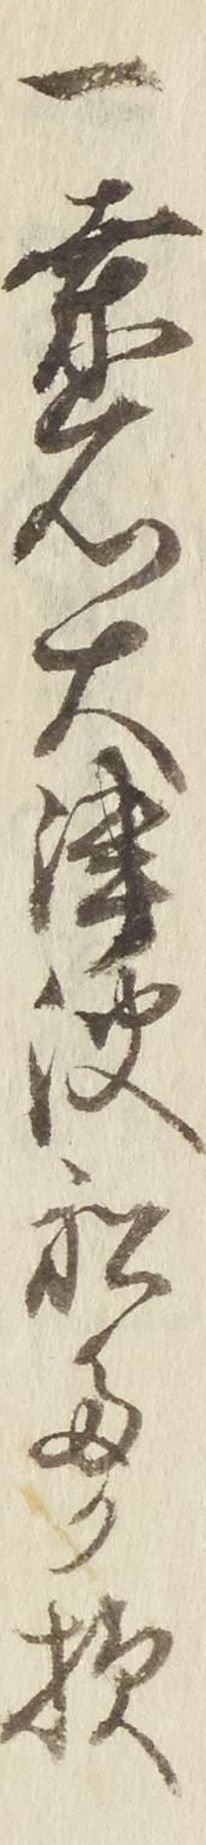一桑名大津波船多く損
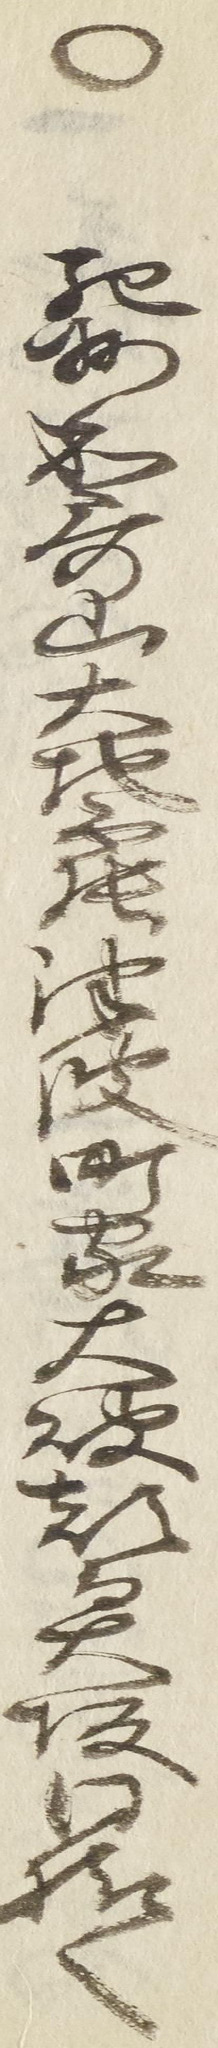◯紀州和歌山大地震津浪町家大破都而大坂同様之
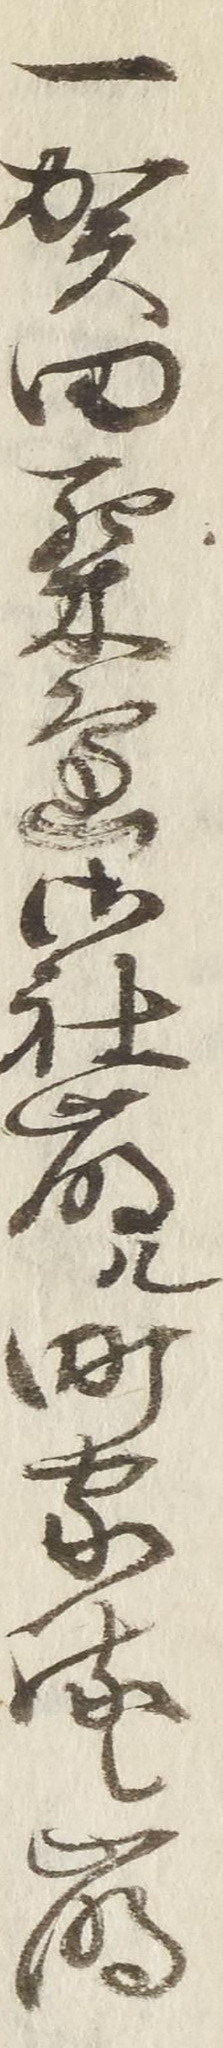一賀田栗嶋御社崩ㇽ町家流れ崩
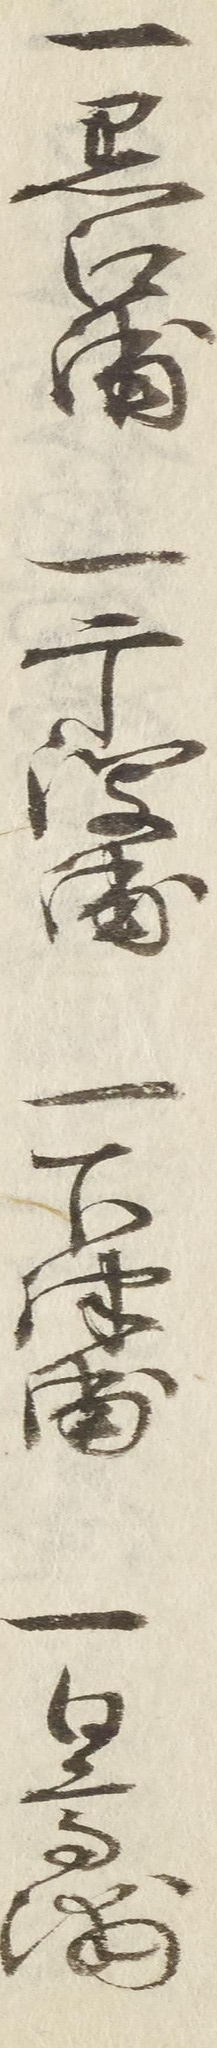一黒江浦一干潟浦一下津浦一日高浦
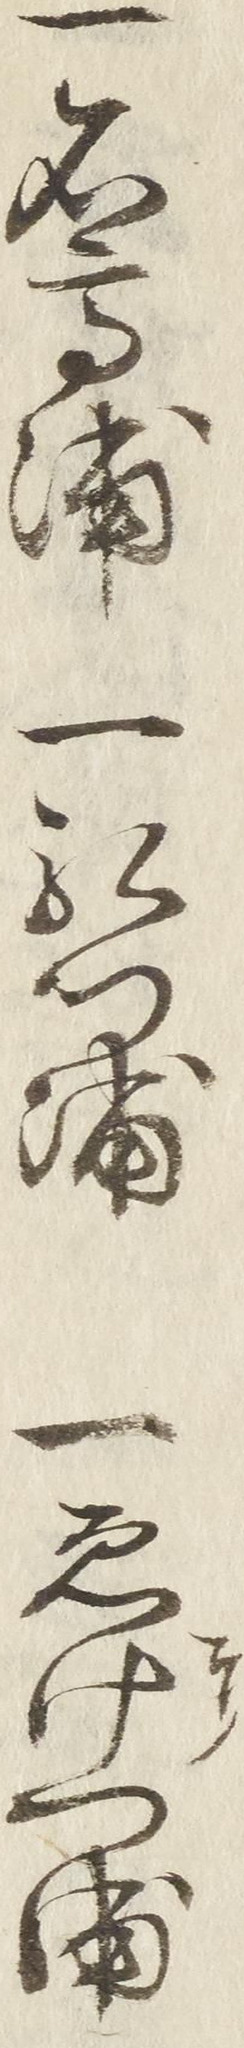一名高浦一弘つ浦一ゑけつ浦
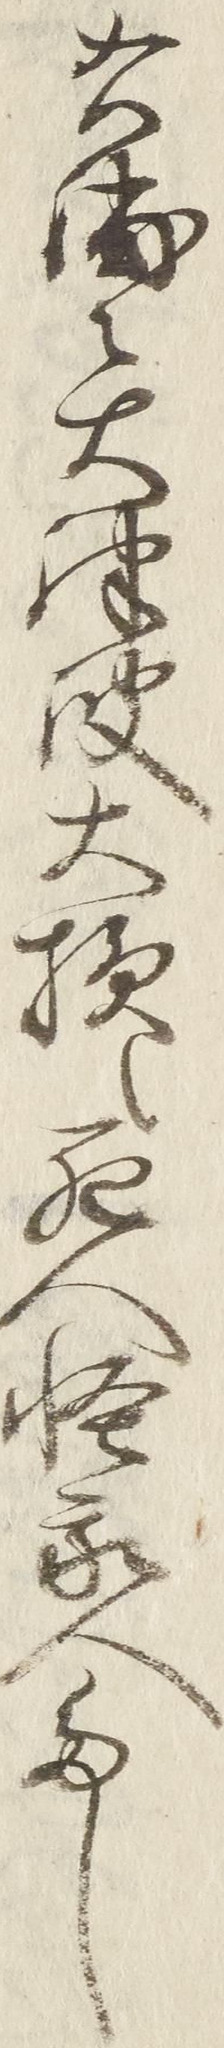右浦々大津波大損し死人怪我人多し
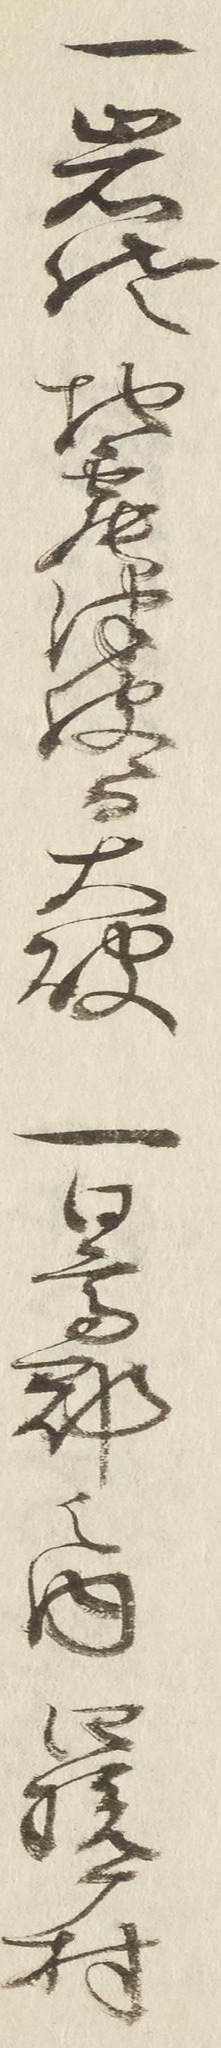一岩佐地震津波二而大破一日高郡之内四拾ヶ村
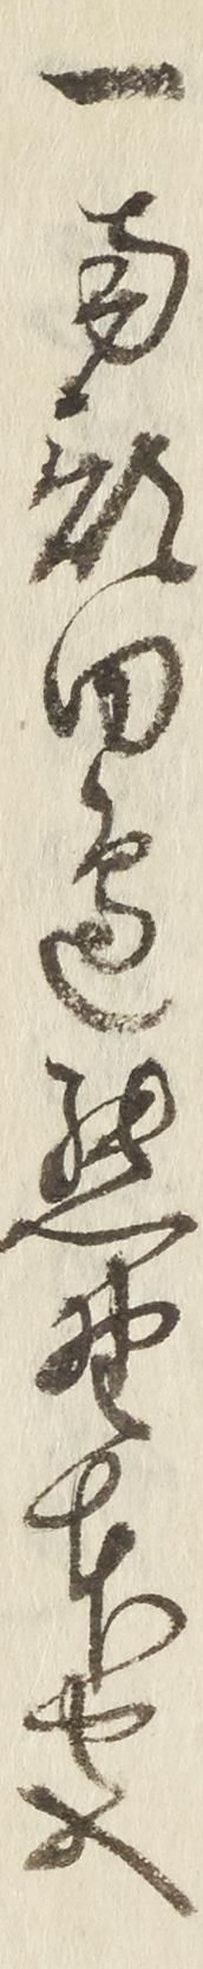一南部田辺熊野本宮
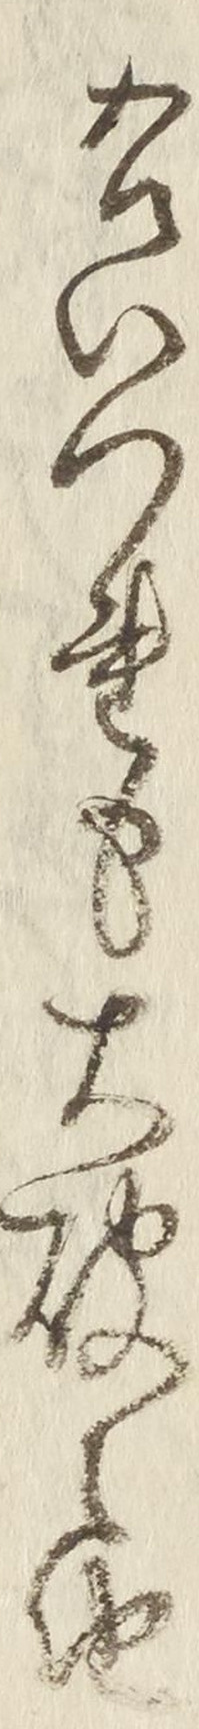右いつれも大破之由
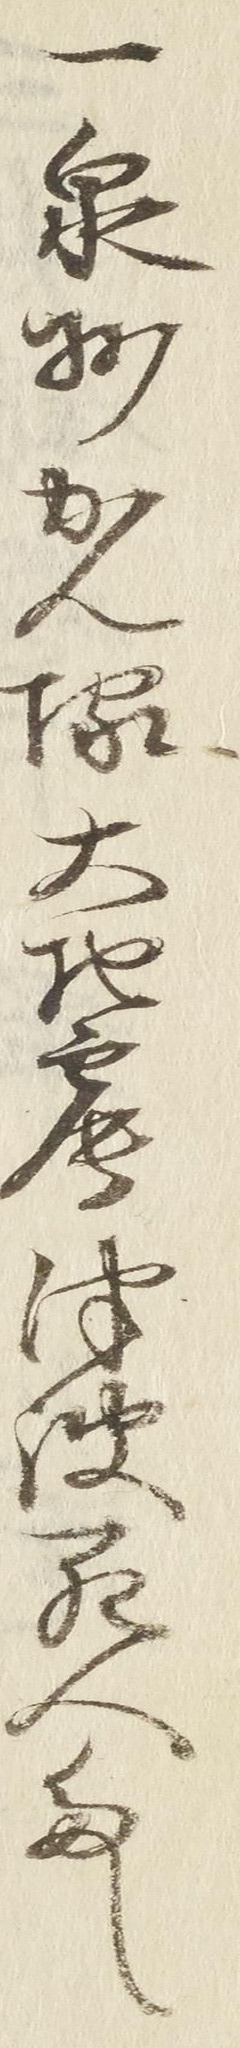一泉洲かい塚大地震津波死人多し
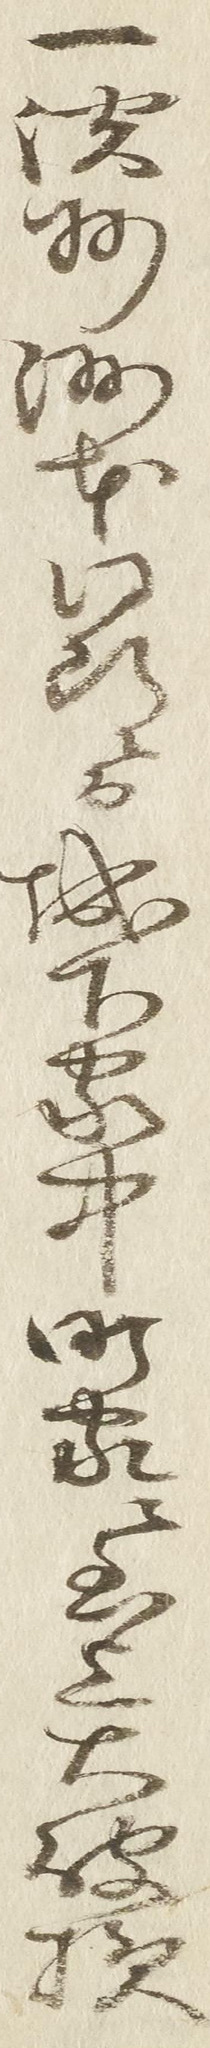一淡洲洲本同断二而城下家中町家二至迄大破損
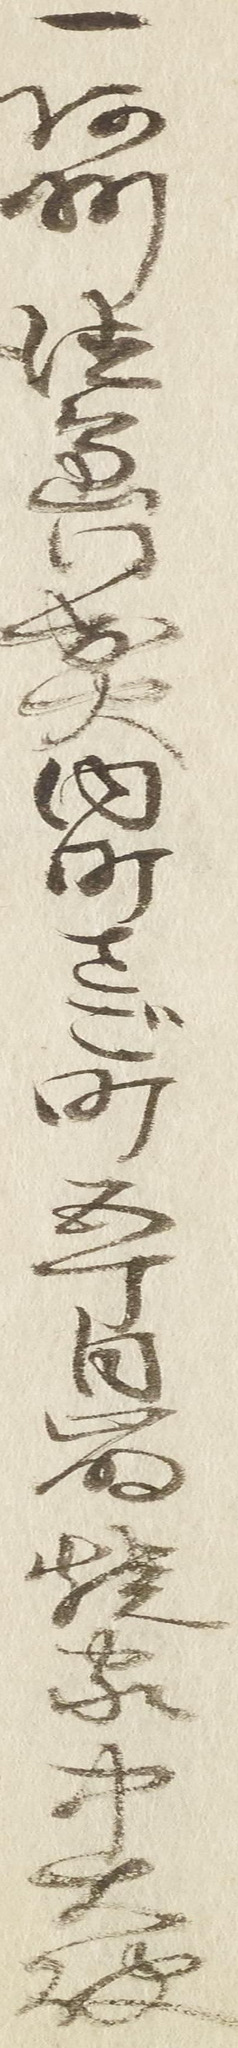一阿洲徳島同出火内町さご町五丁目崩焼家中大破
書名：地震記　下
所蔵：東京大学地震研究所図書室 Earthquake Research Institute Library, The University of Tokyo, JAPAN
